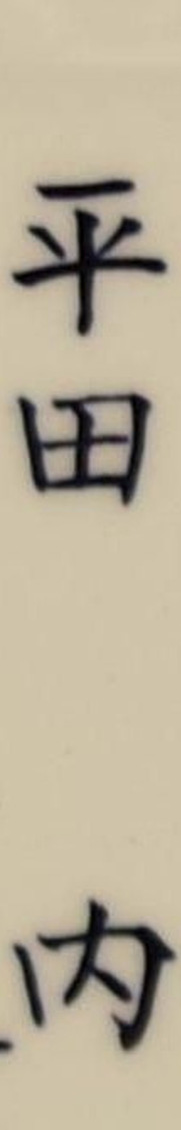平田内
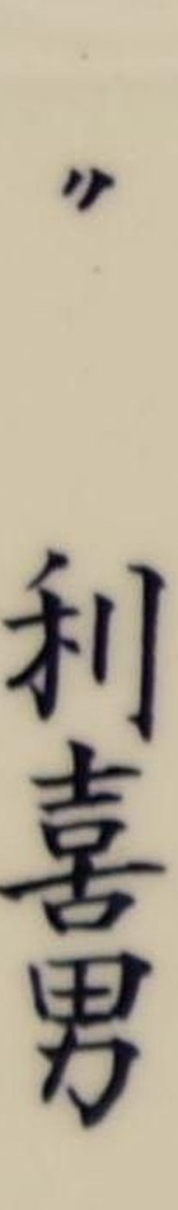利喜男
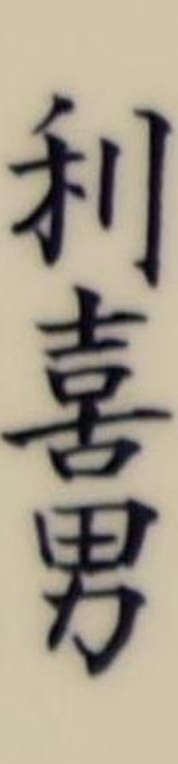利喜男
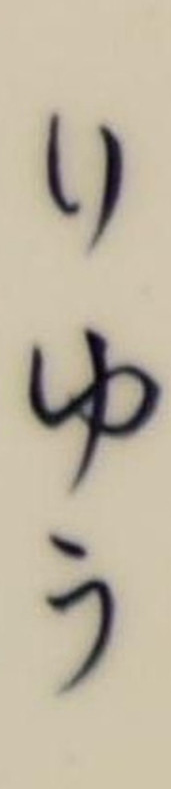りゆう
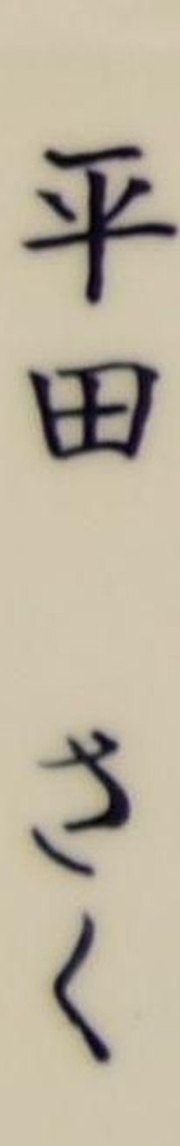平田さく
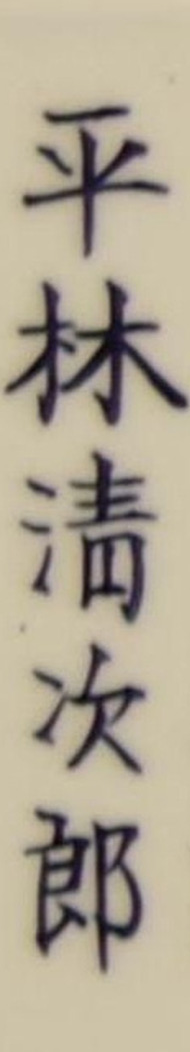平林清次郎

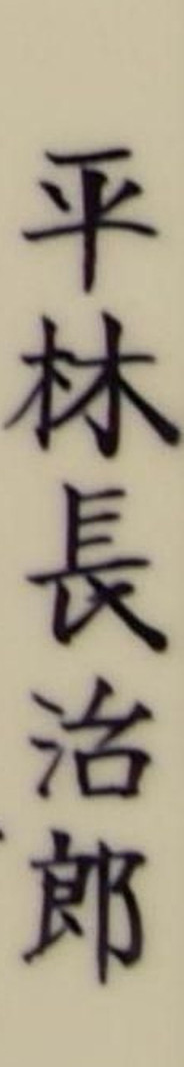平林長治郎
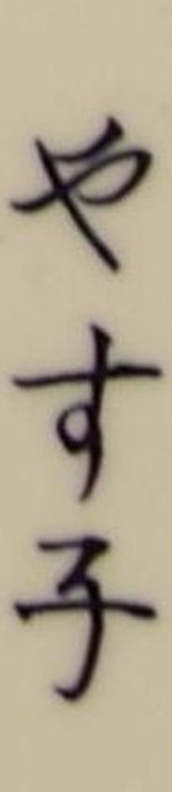やす子
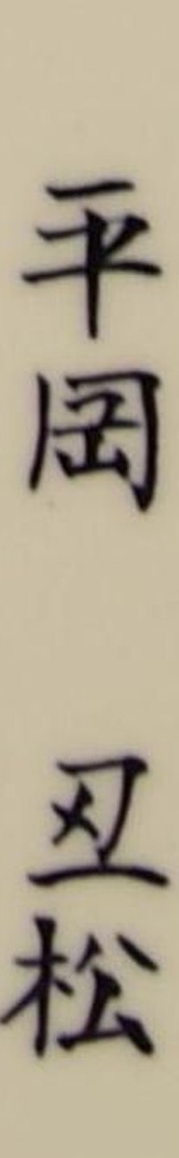平岡丑松
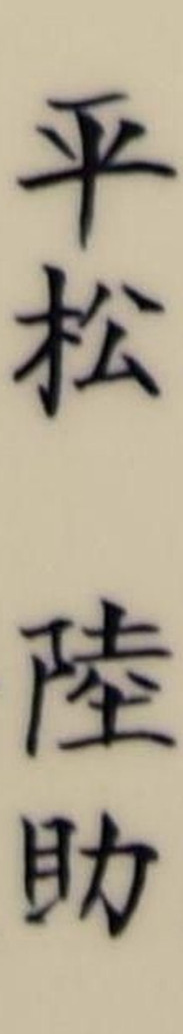平松陸助
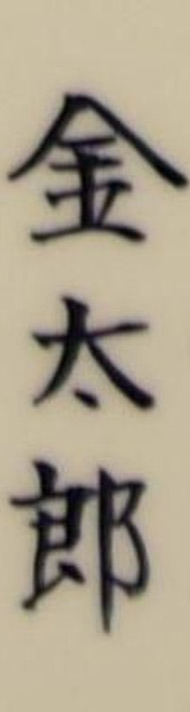金太郎
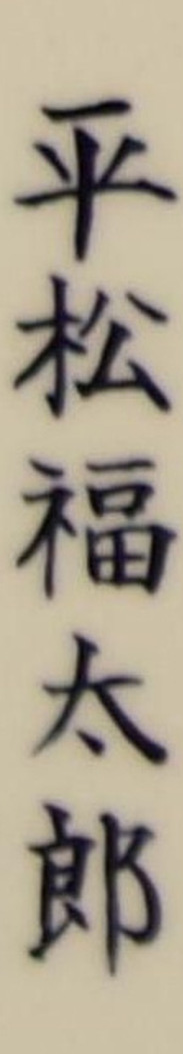平松福太郎
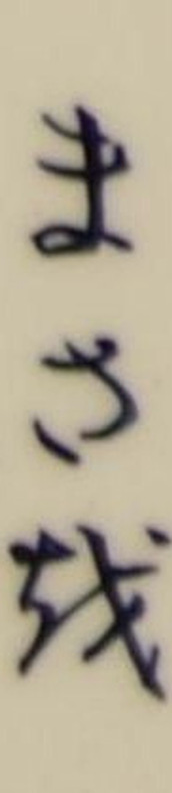まさを
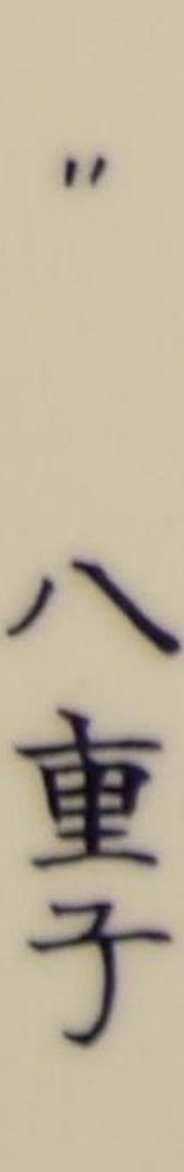八重子
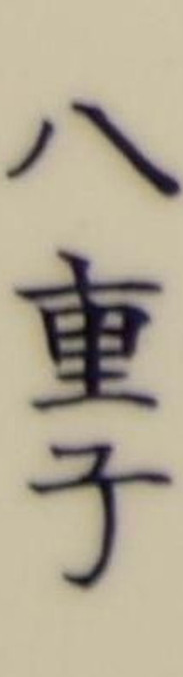八重子
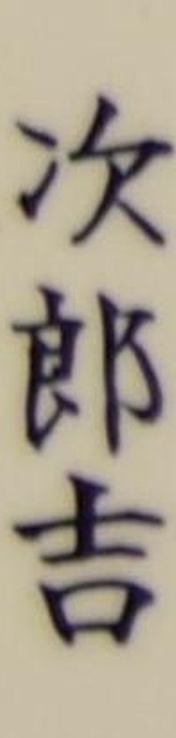次郎吉
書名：A~D
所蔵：koyasan kongobuji
